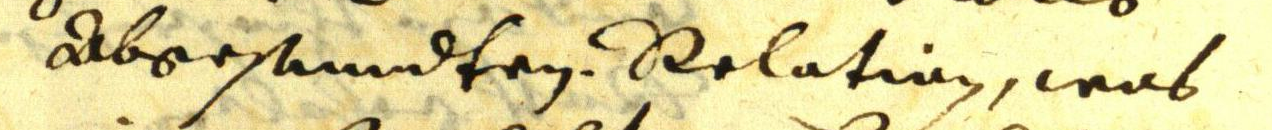Abgesanndten. Relation, was
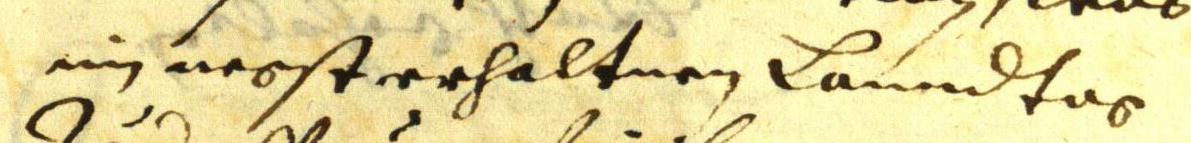im negst erhaltnen Lanndtag
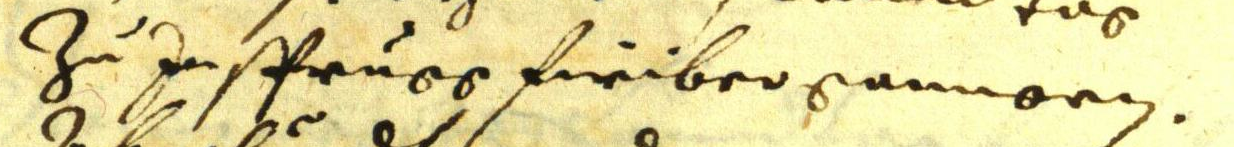Zū InsPrūgg firiber ganngen.
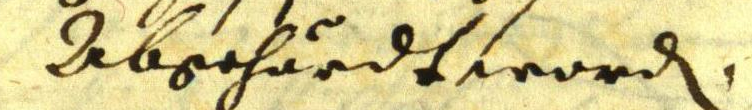Abgehōrdt word.
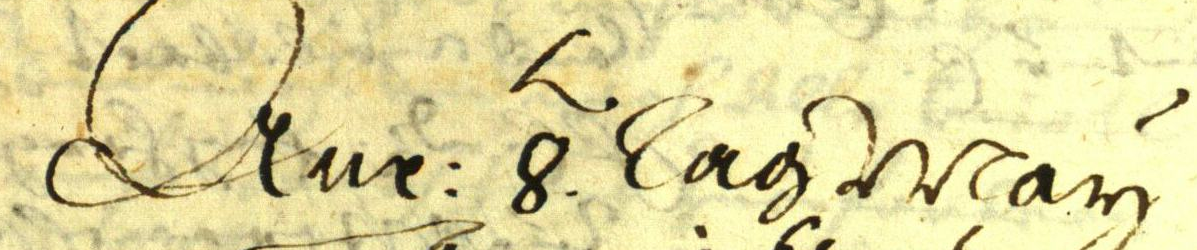Am: 8t. Tag Maȳ
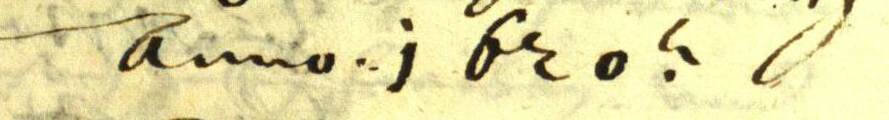Anno: 1620 t.
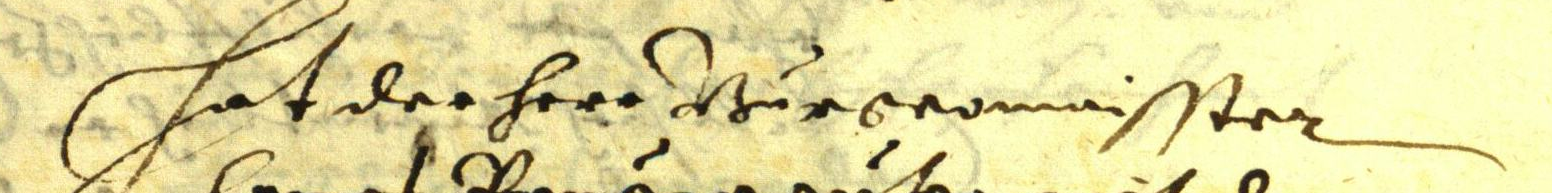hat der herr Būrgermaisster
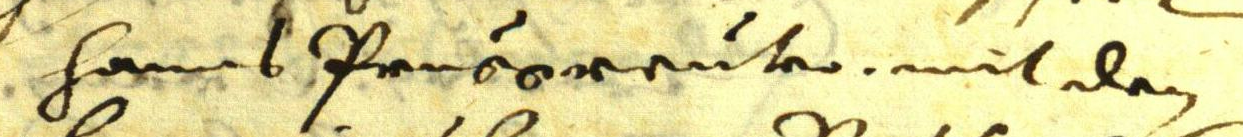hanns Prūggreūter. mit den
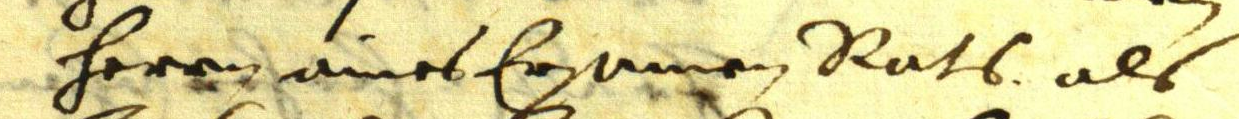herrn aines Ersamen Rats. als
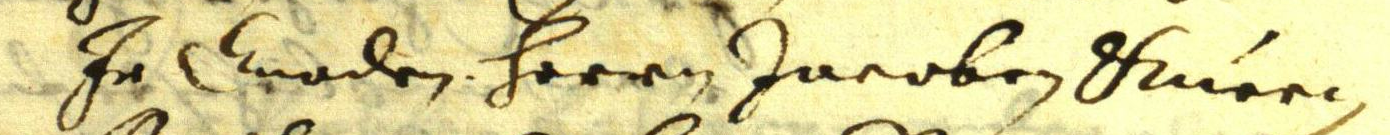Ir Gnaden. herrn Jacoben Kūeen
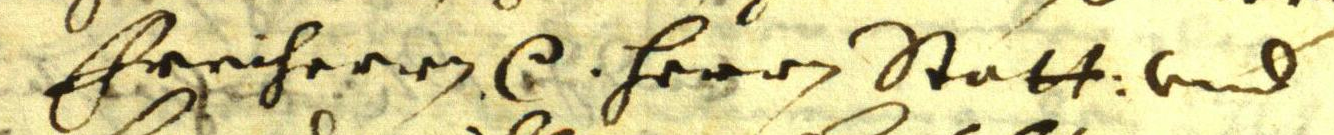Freiherrn etc. herrn Statt: vnd
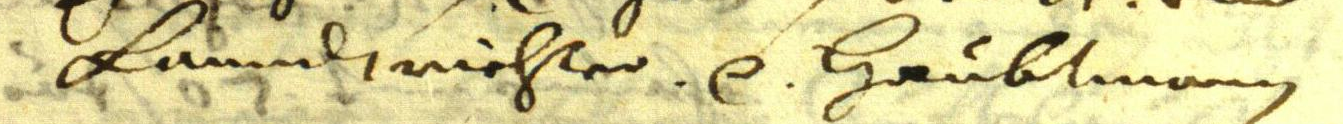Lanndtrichter. etc. Haūbtmann
